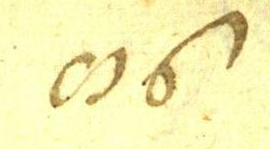86
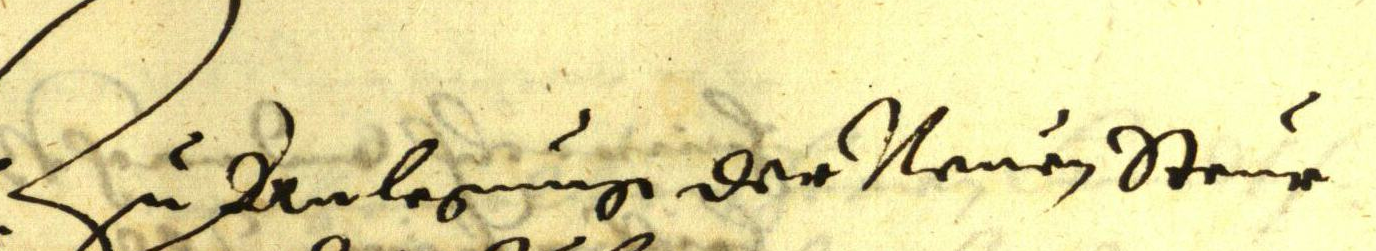Zū Anlegūng der Neūen Steūr
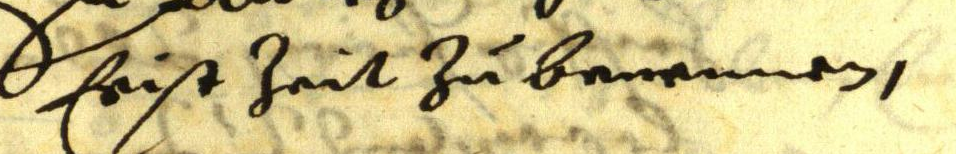Eeist Zeit Zū benennen,
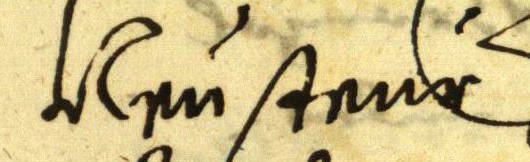Neū steūr
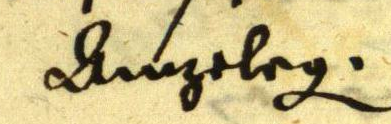Anzeleg.
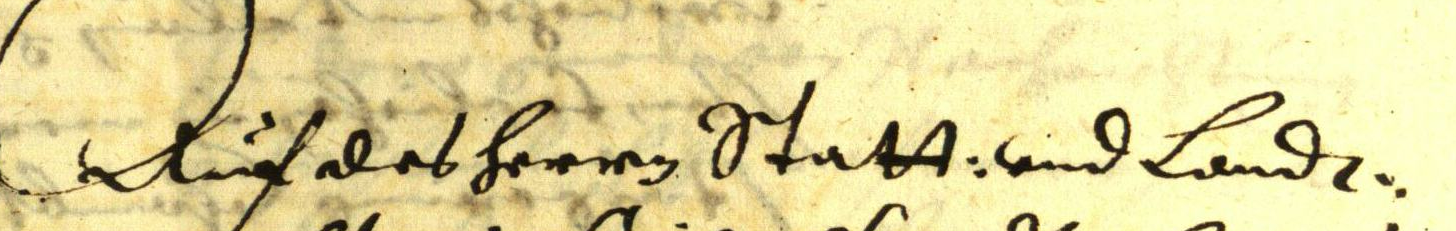Aūf des herrn Statt: vnd Landt¬
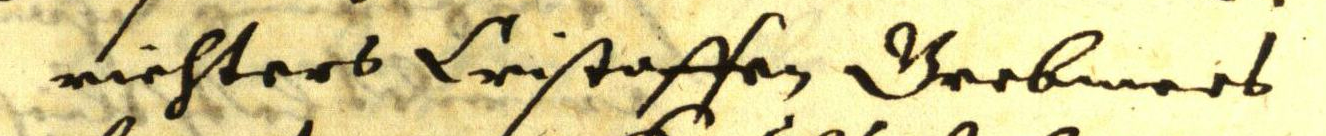richters Cristoffen Grebmers
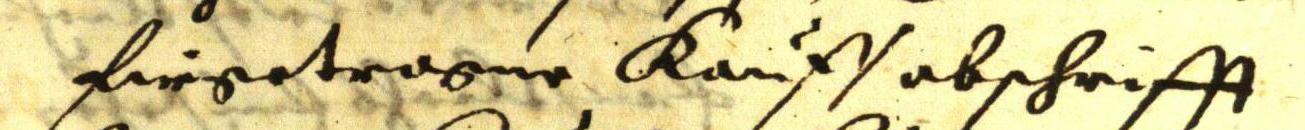firgetragne Kaūfsabschrifft
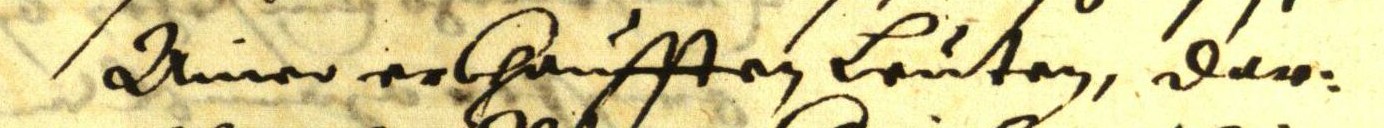Ainer erkhaūfften Leūten, dar¬
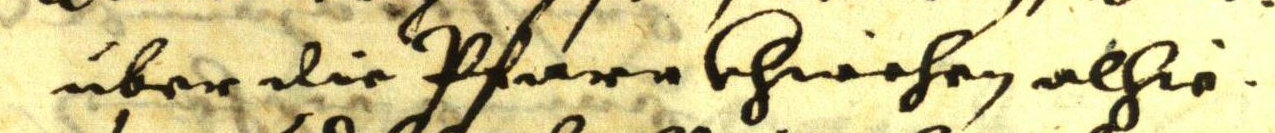ūber die Pfarr khirchen alhie.
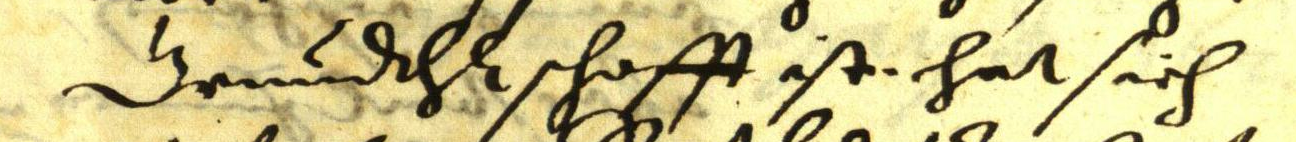Grūndthschafft ist. hat sich
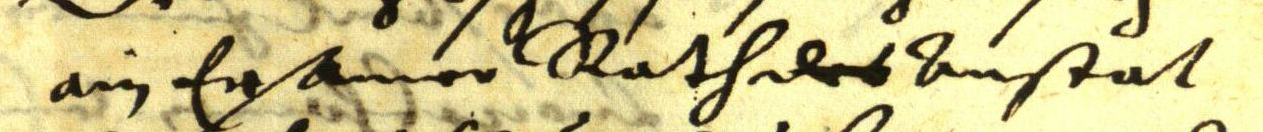ain Ersamer Rath des Anstat
